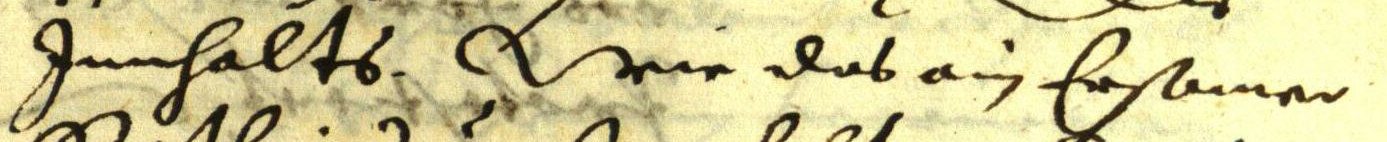Innhalts. Wie das ain Ersamer
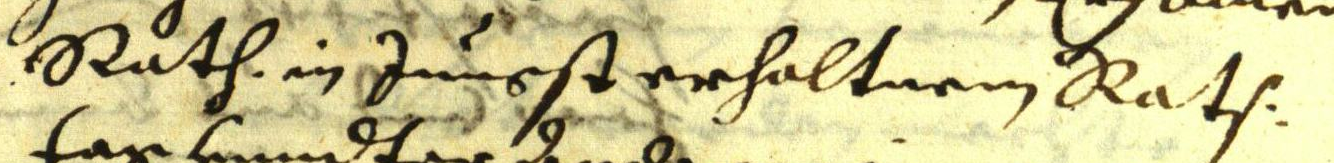Rath. in Jūngst erhaltnem Rats¬
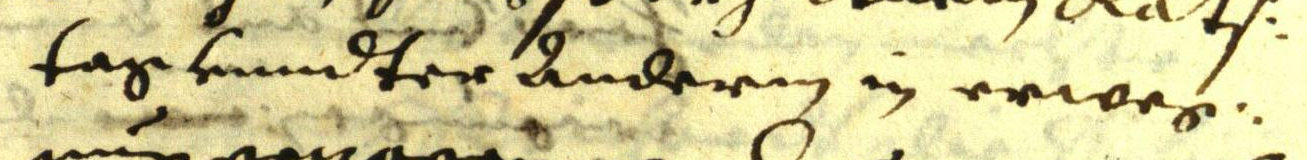tag vnndter Anderm in erweg¬
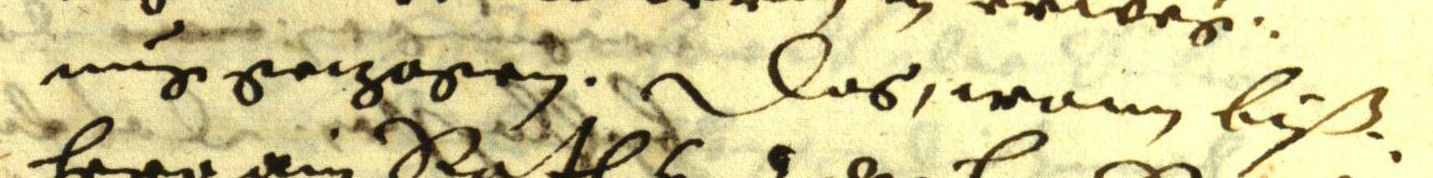ūng gezogen. das, wann biß¬
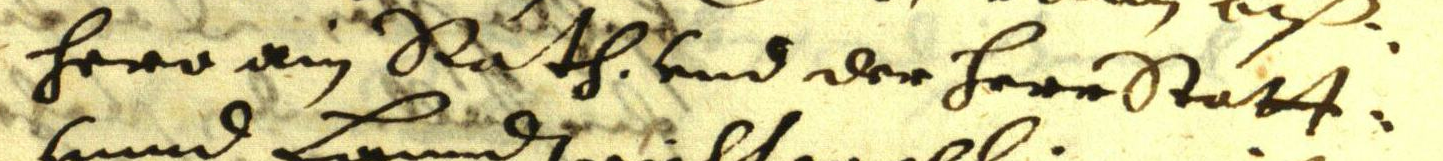hero ain Rath. vnd der herr Statt¬
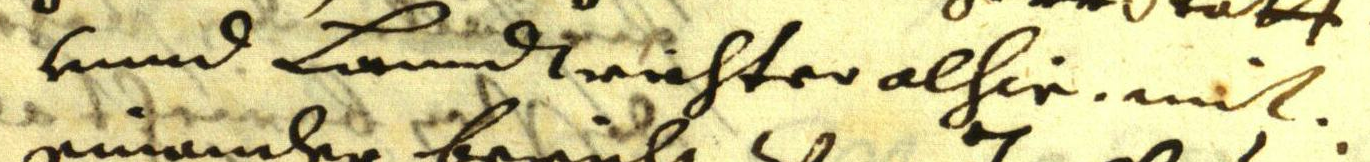vnnd Lanndtrichter alhie. mit¬
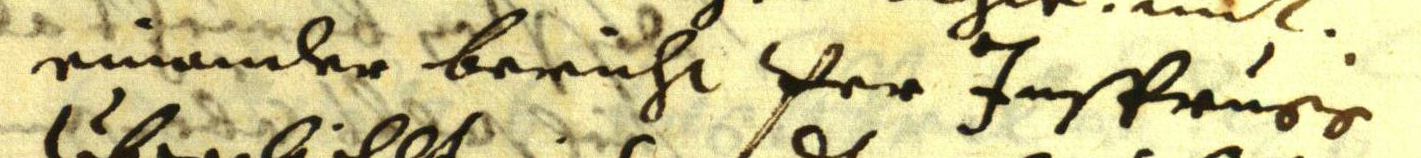einander bericht Per InsPrūgg
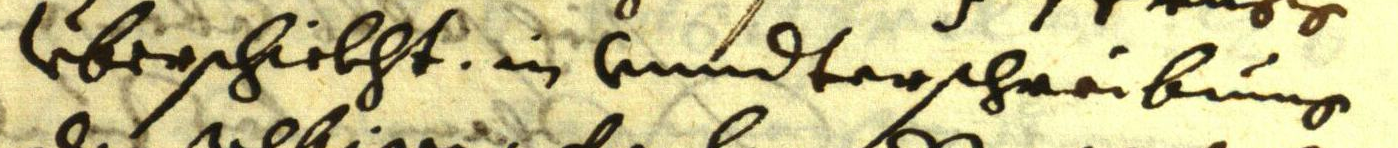v̄berschickht. in vndterschreibūng
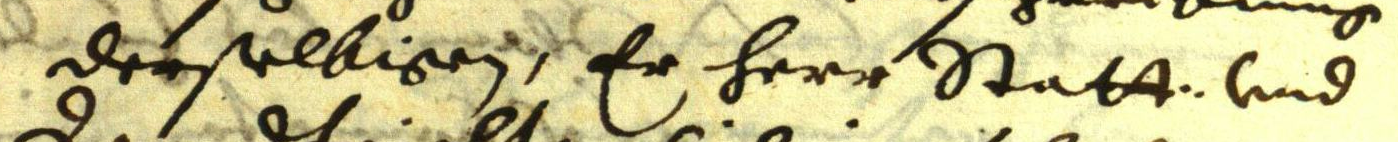derselbigen, Er herr Statt: vnd
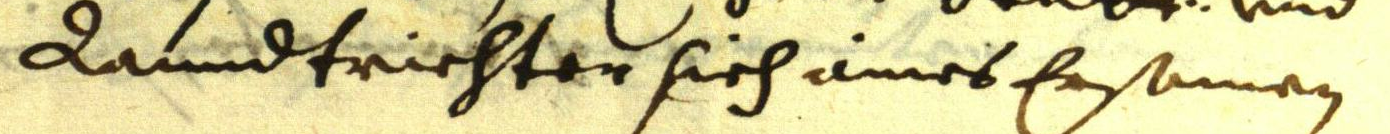Lanndtrichter sich aines Ersamen
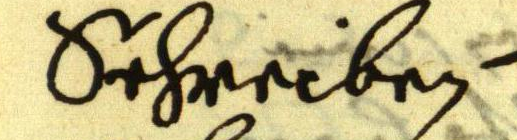Schreiben
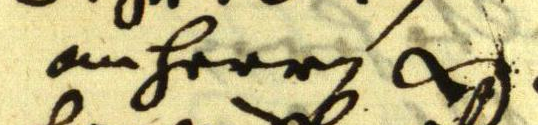an herrn
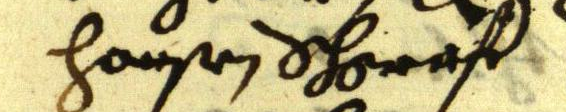Hansen Schgraf
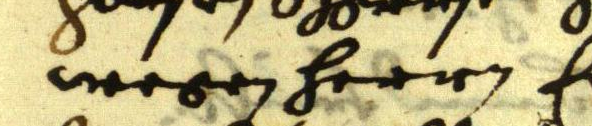wegen herrn
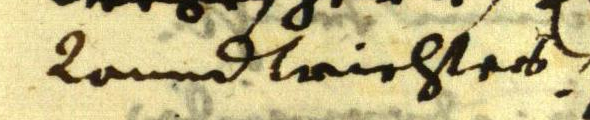Lanndtrichters
